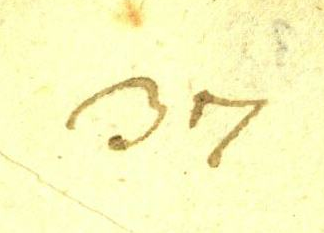37
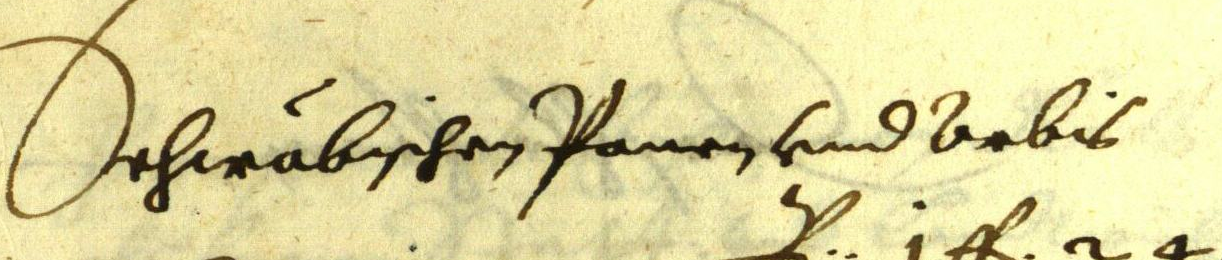Schwābischen Ponen vnd Arbis
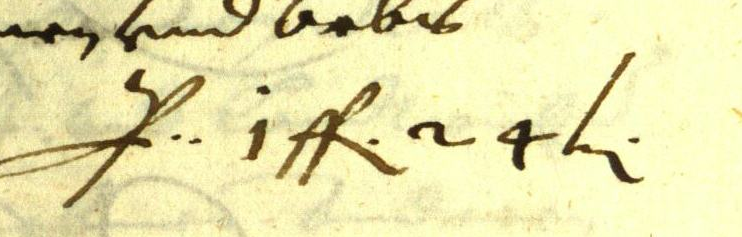P: 1 fl. 24 k.
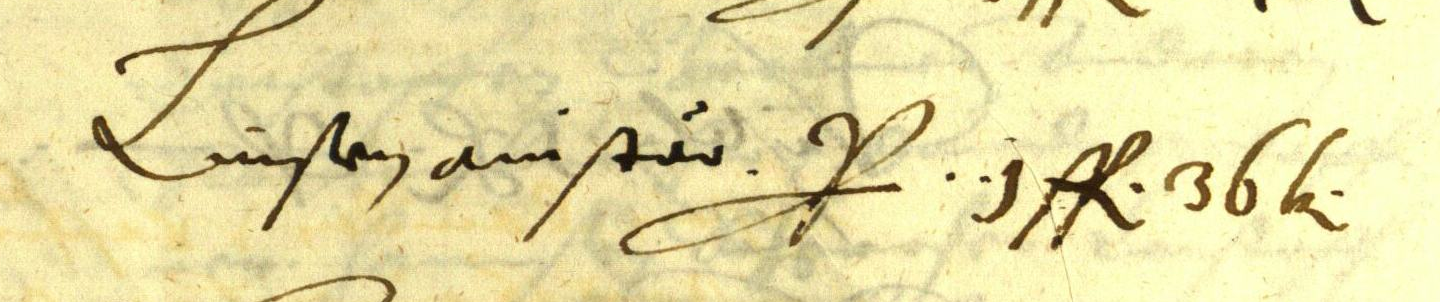Linsen ain stär. P: 1 fl. 36 k.
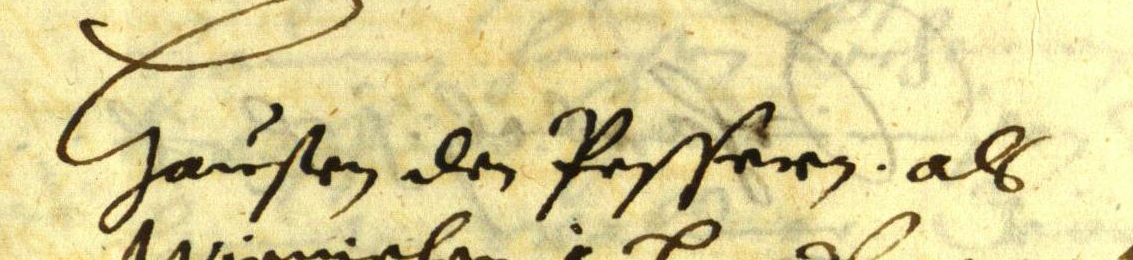Haūsten den Pessern. als
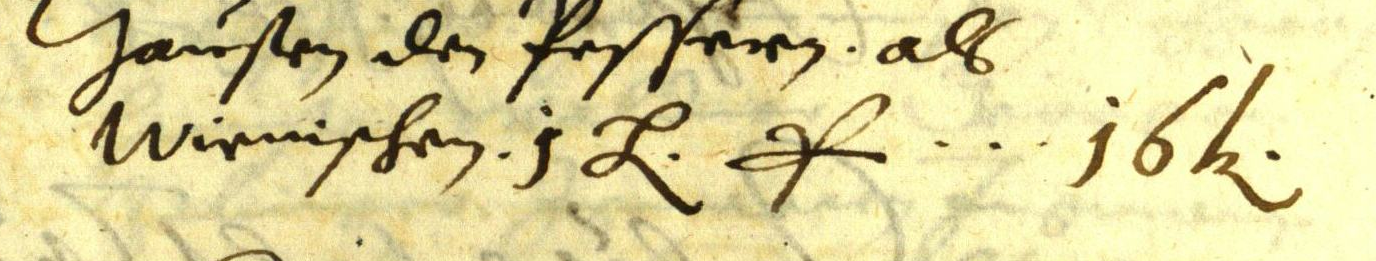Wienischen. 1 L. P: 16 k.
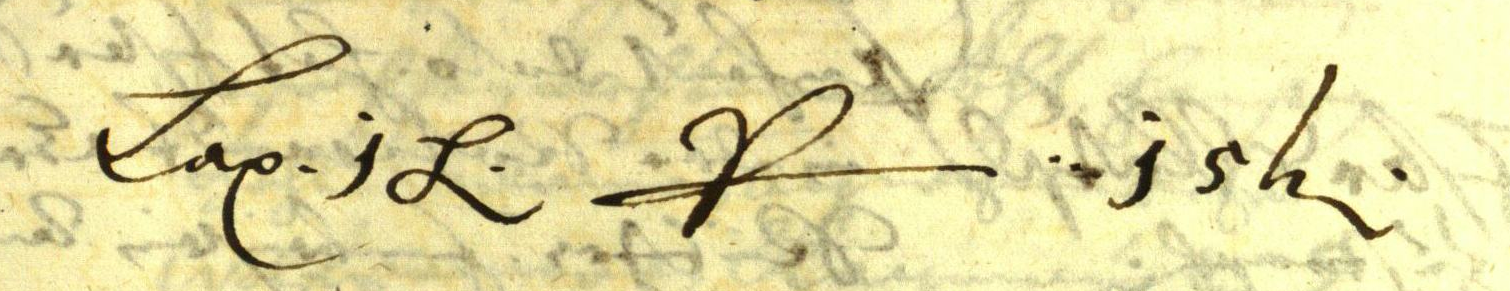Lax. 1 L. P: 15 k.
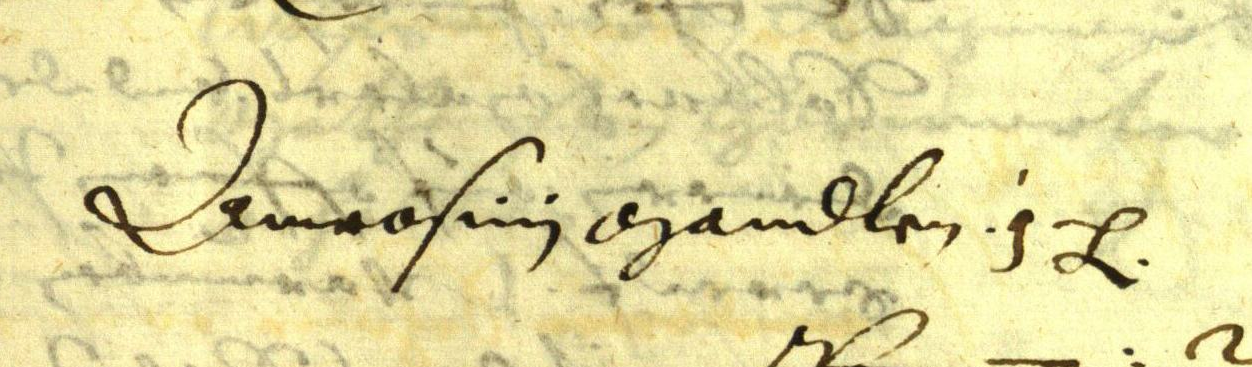Amrosini Mandlen. 1 L.
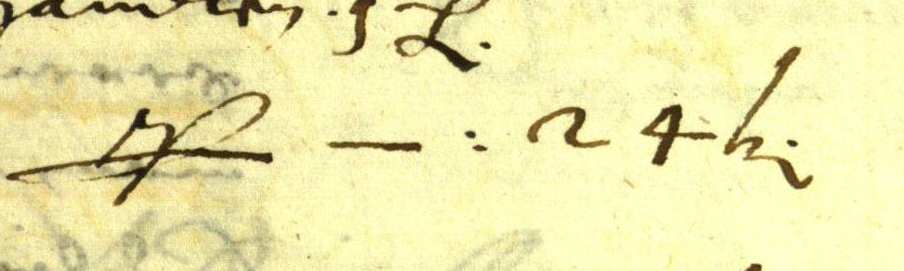P —: 24 k.
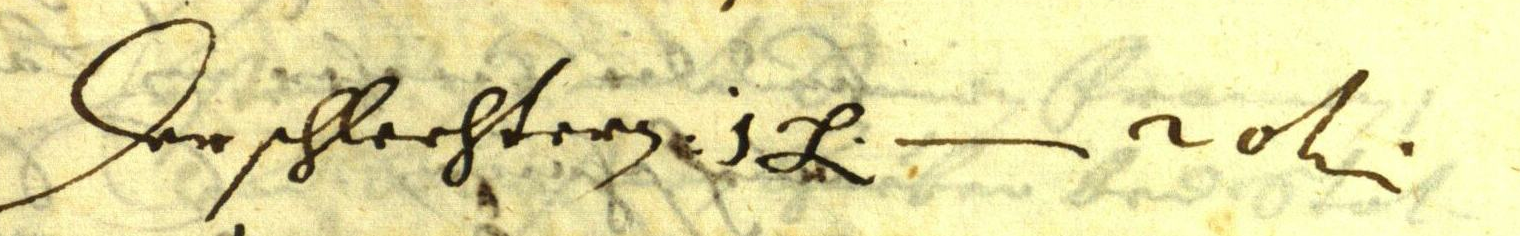Der schlechtern: 1 L. — 20 k.
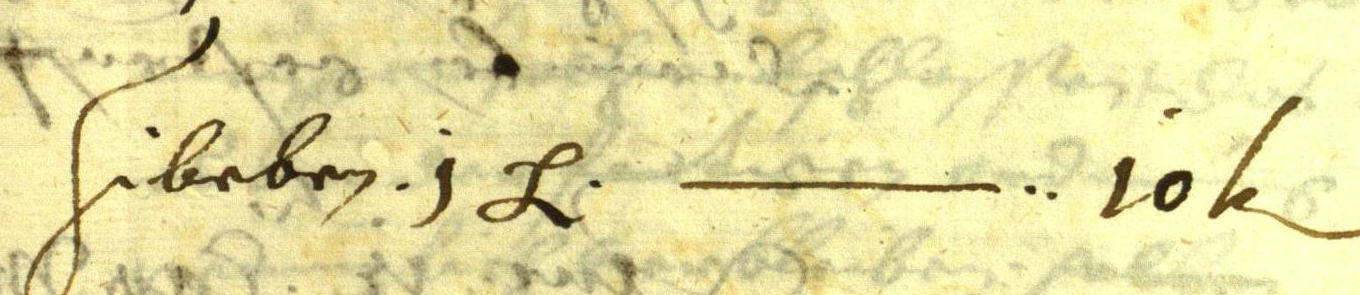Zibeben. 1 L. —: 10 k.
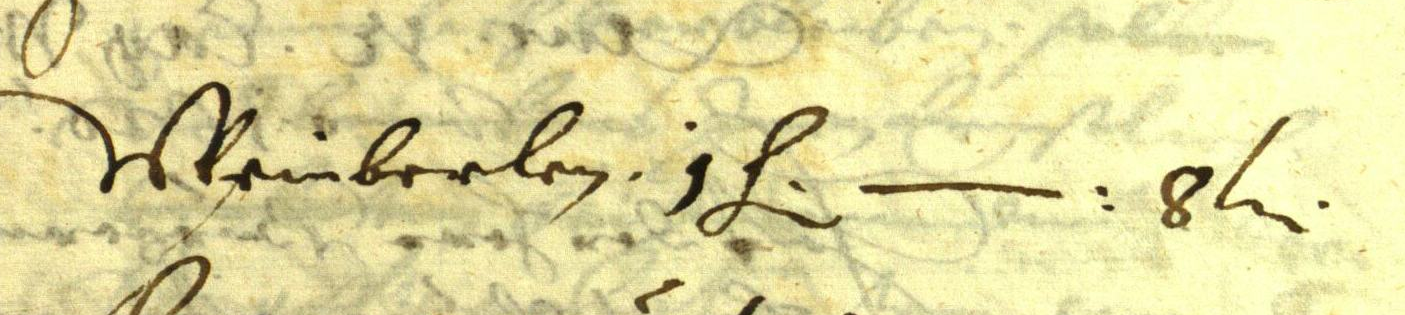Weinberlen. 1 L. —: 8 k.
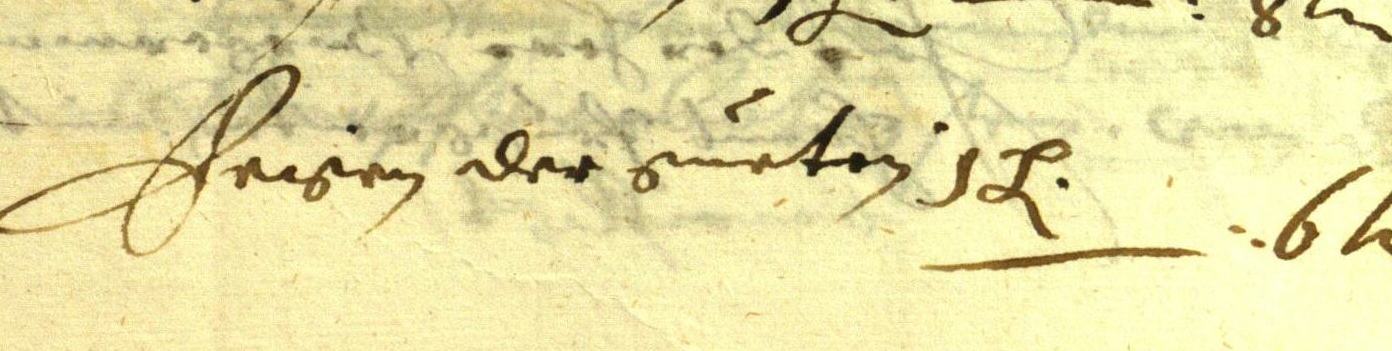Feigen der gūeten 1 L. —: 6 k.
